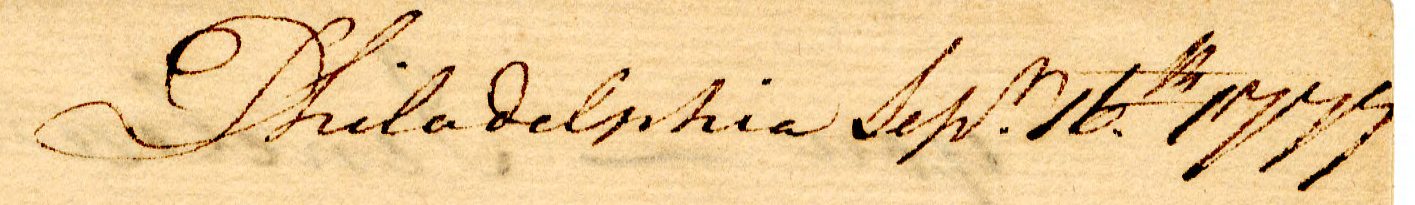Philadelphia Sep^r. 16^th. 1777
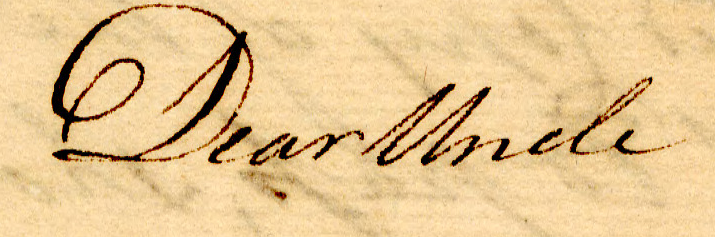Dear Uncle
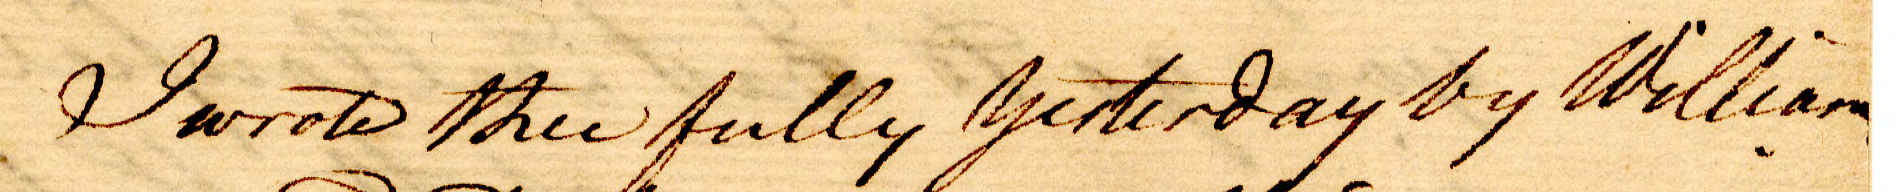I wrote thee fully Yesterday by William
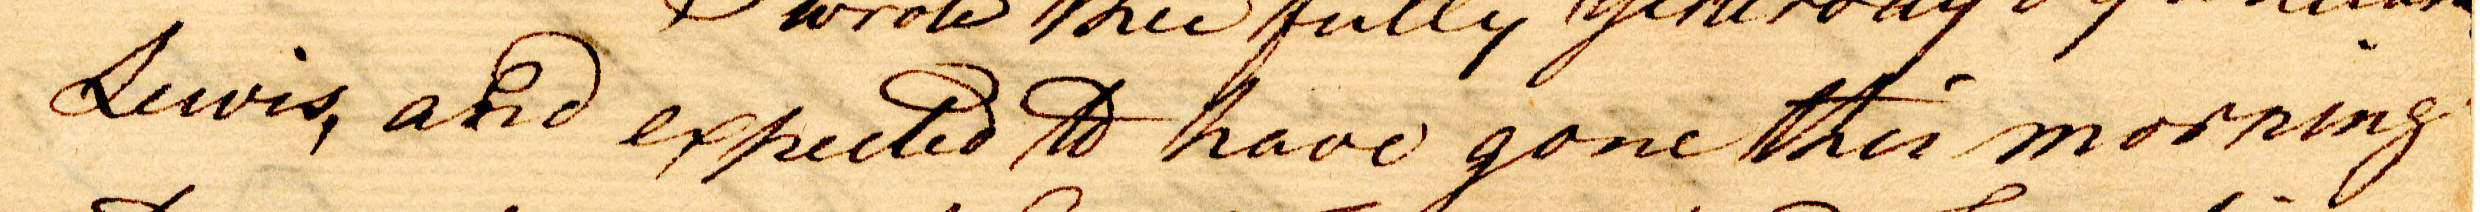Lewis, and expected to have gone this morning
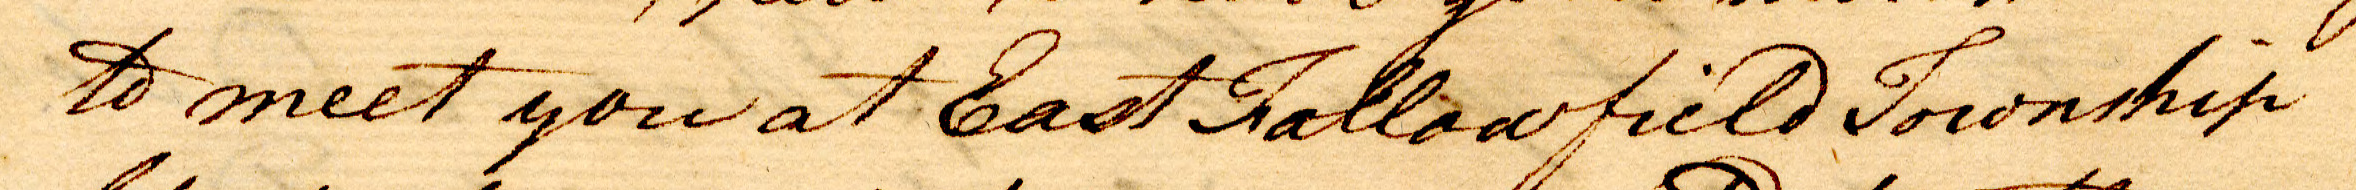to meet you at East Fallowfield Township
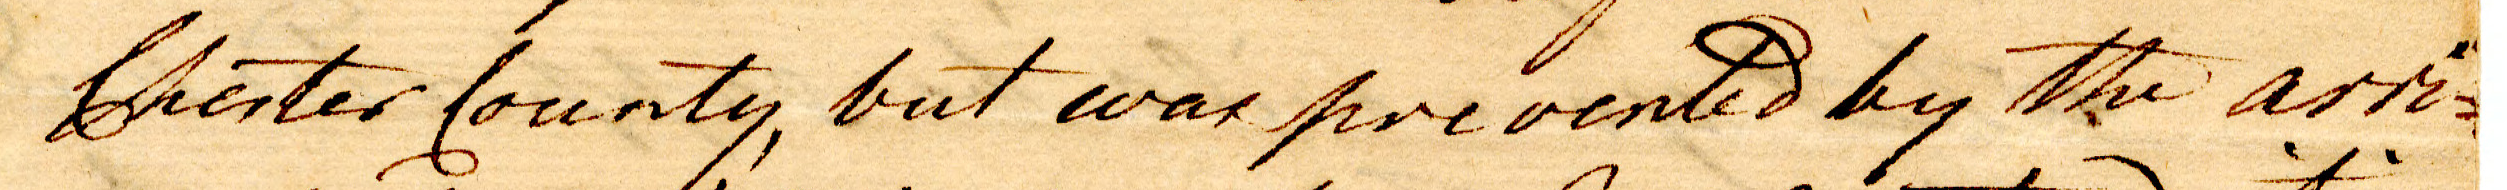Chester County, but was prevented by the arri-
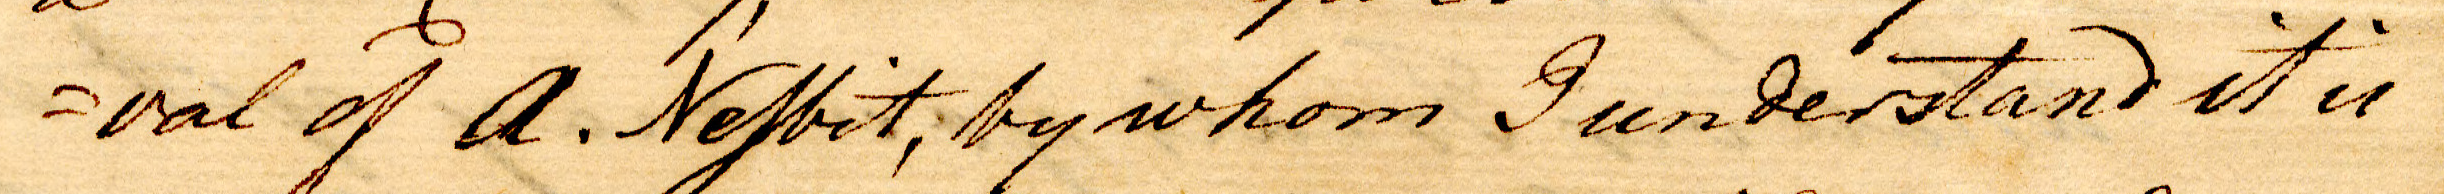-val of A. Nesbit, by whom I understand it is
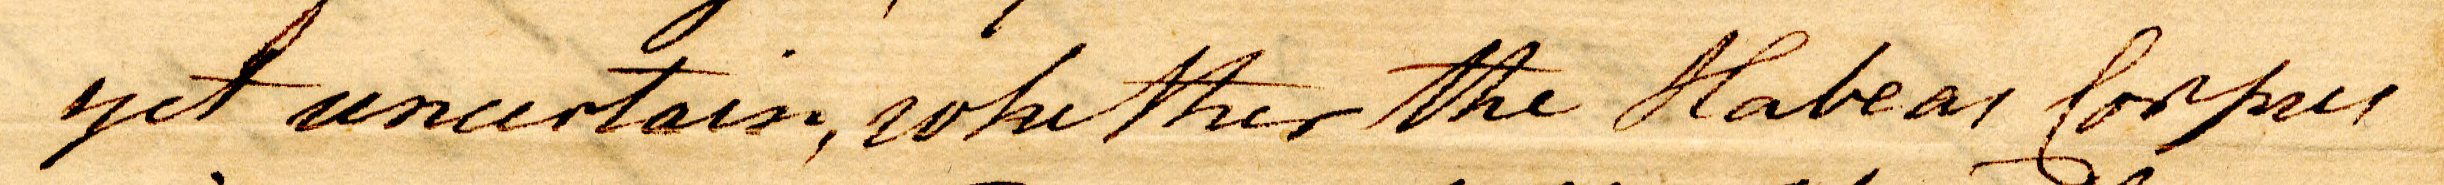yet uncertain, whether the Habeas Corpus
